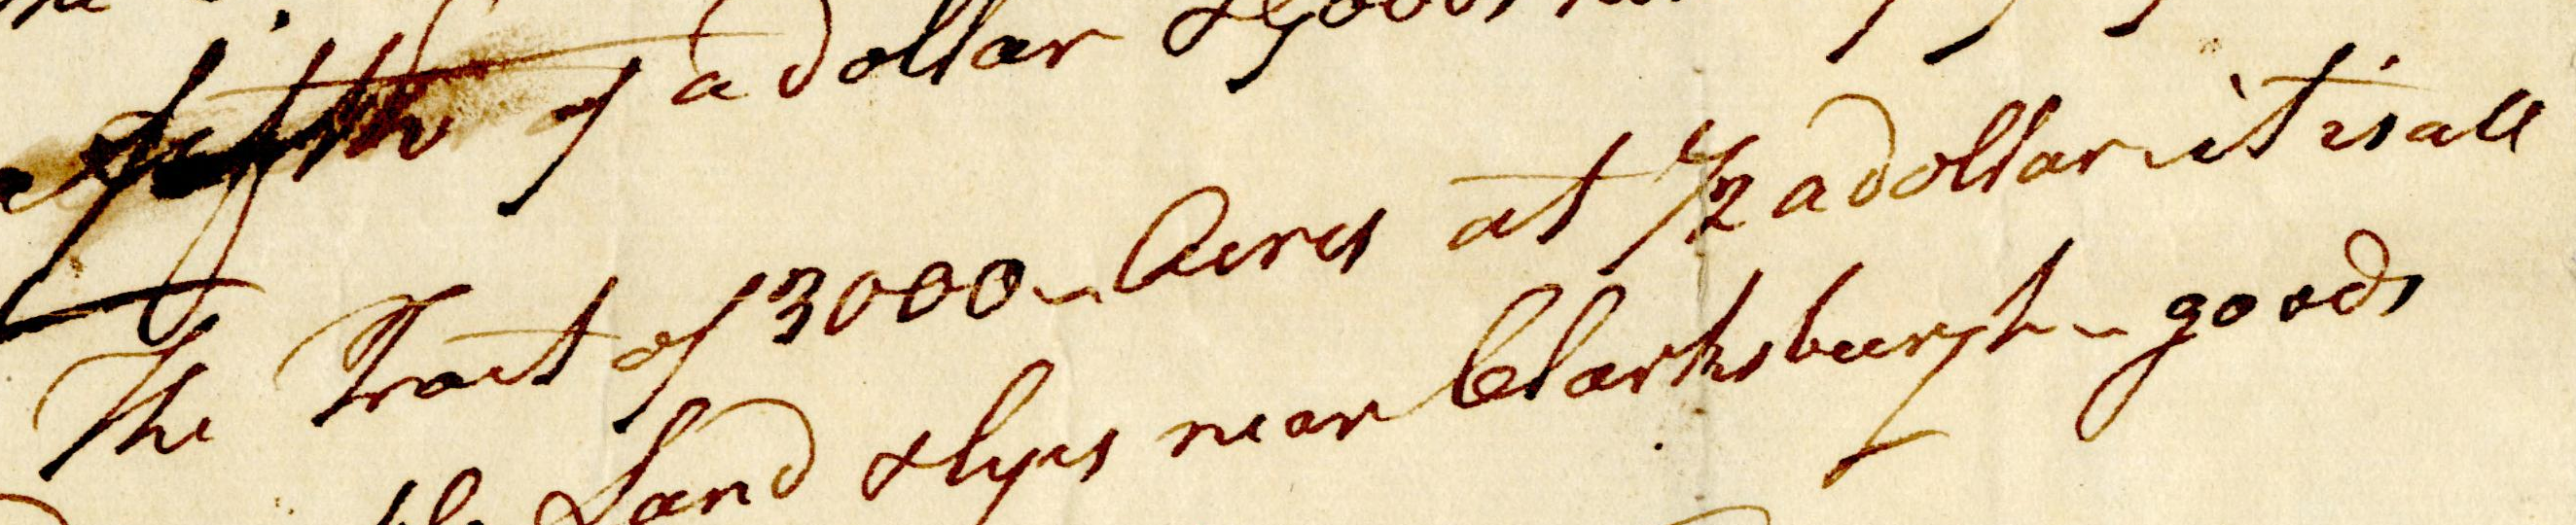The Tract of 3000 acres at 72 a dollar it is all
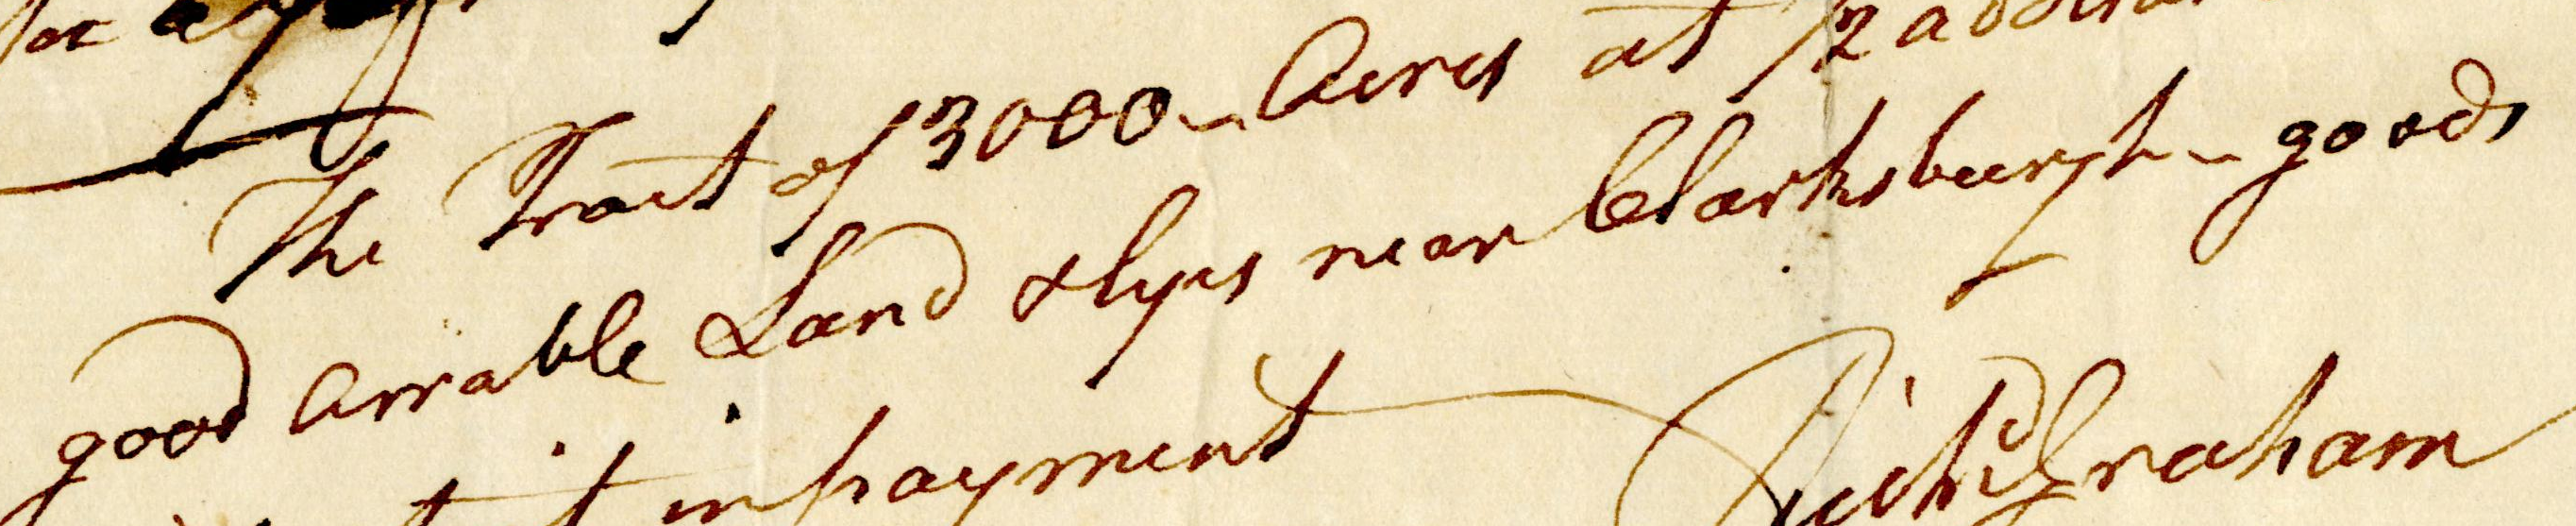good arable Land & lays near Clarksburgh- goods
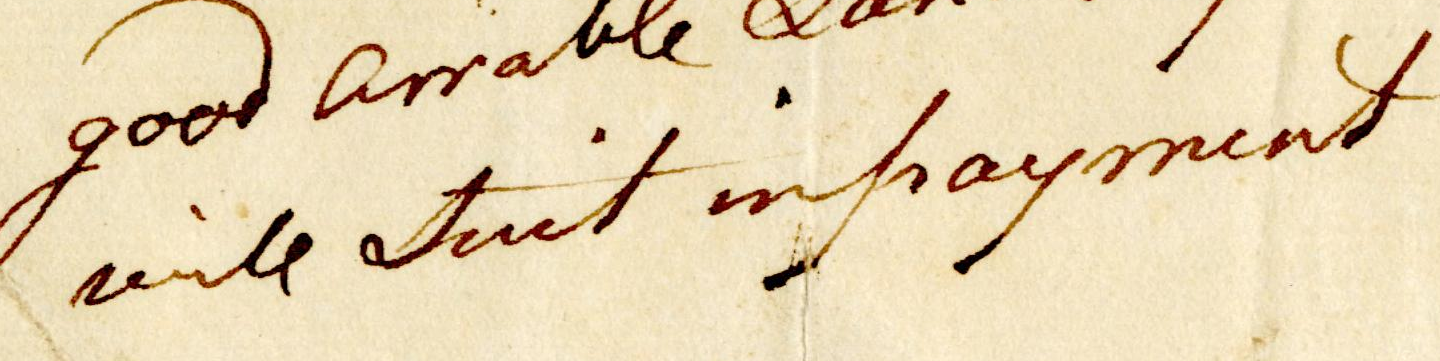will suit in payment
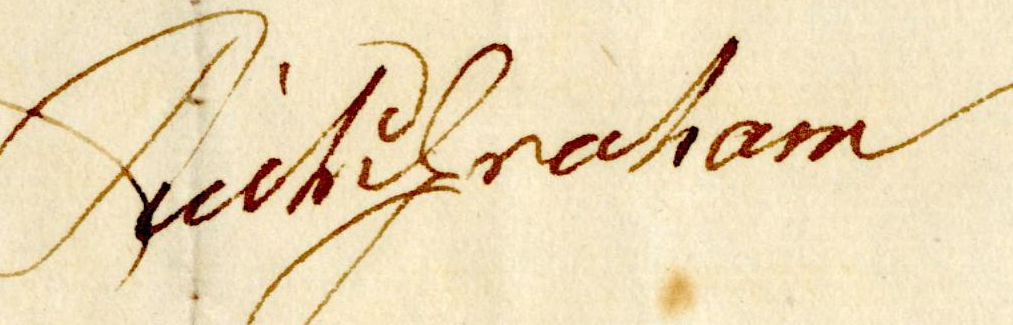Rich^d Graham
